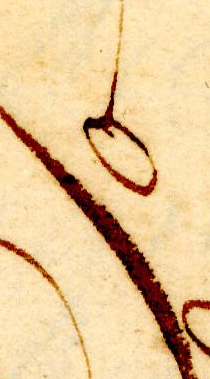To
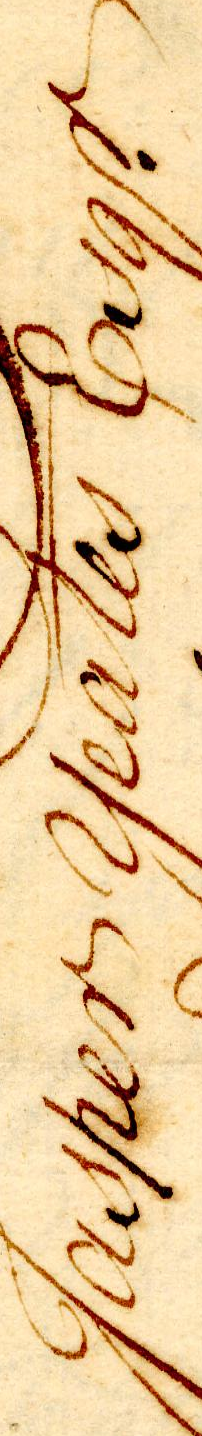Jasper Yeates Esq^r.
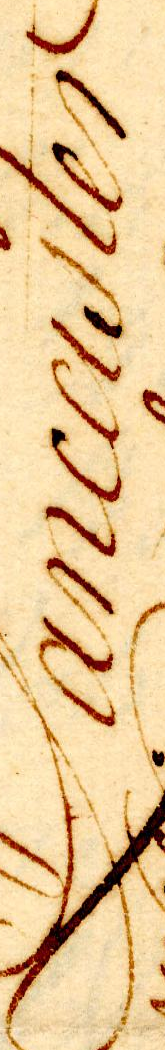Lancaster
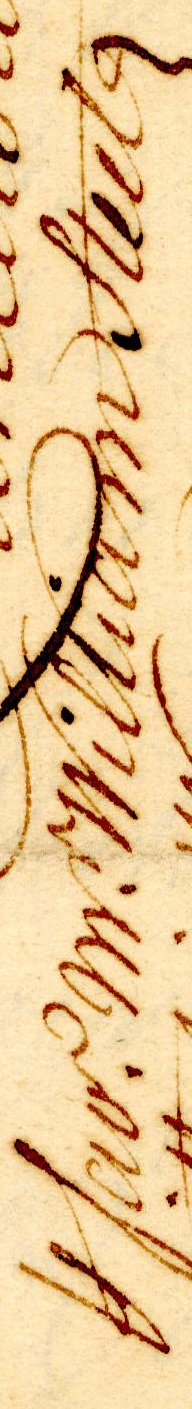Per fav^r. M^r. William Steel
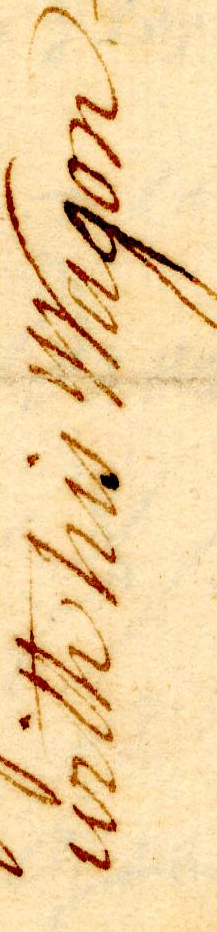with his Wagon
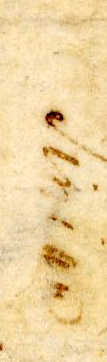Tinian
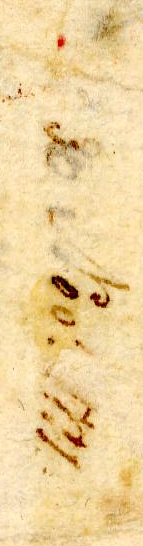30 Nov^r. 1777
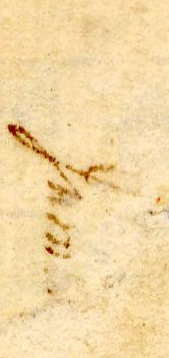James
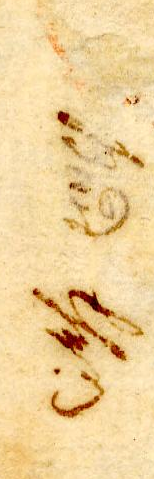Burd Esq^r.
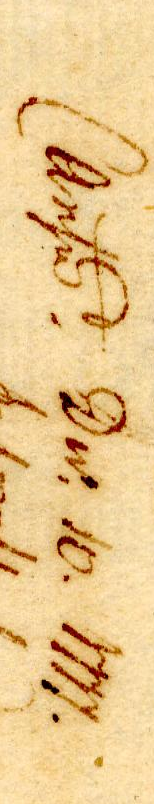(Answ^d. Dec^r. 10. 1777.
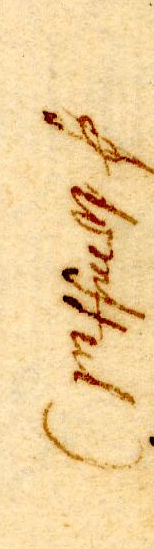per W^m Steel)
